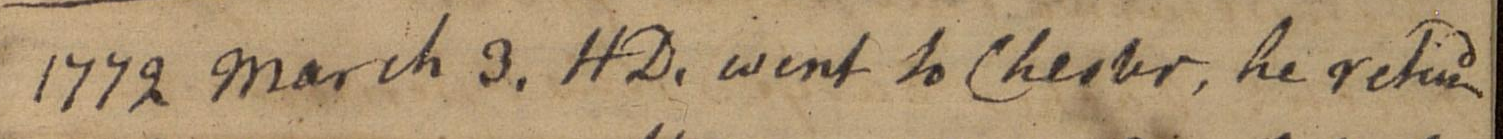1772 March 3. HD. went to Chester, he return^d
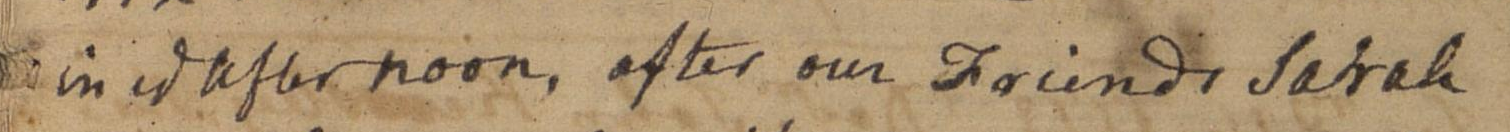in y^e afternoon, after our Friends Sarah
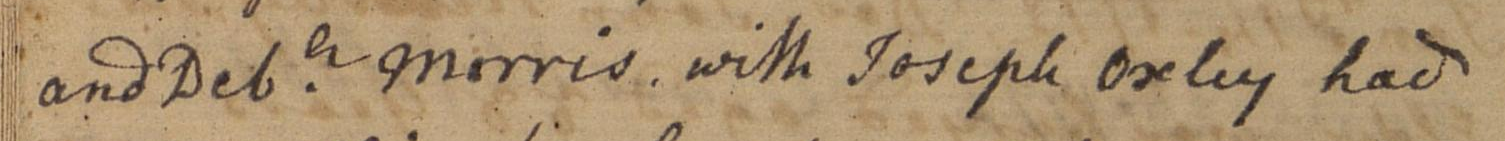and Deb^h. Morris, with Joseph Oxley had
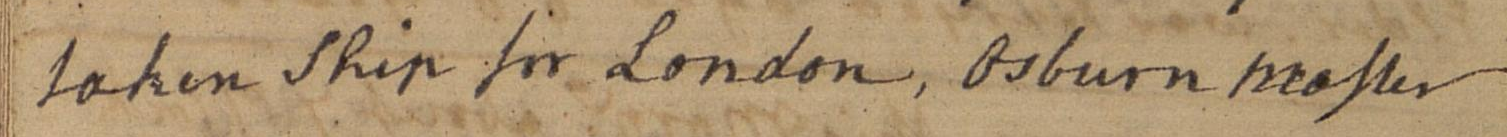taken Ship for London, Osburn Mosser
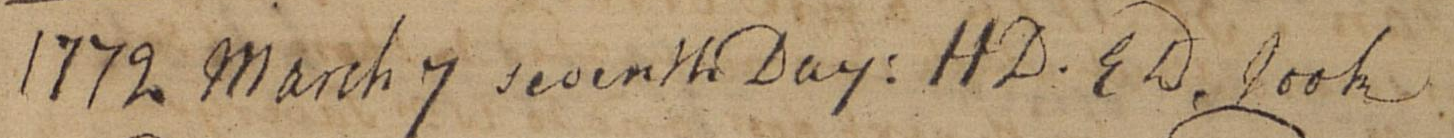1772 March 7 seventh Day: HD. ED. took
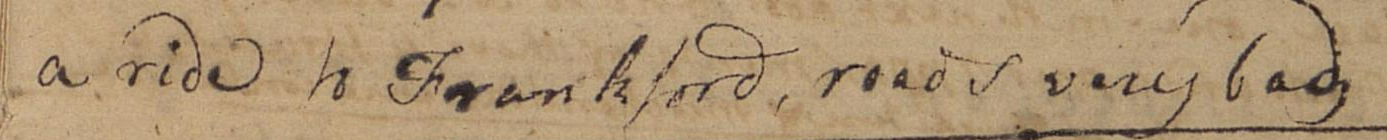a ride to Frankford, road s very bad
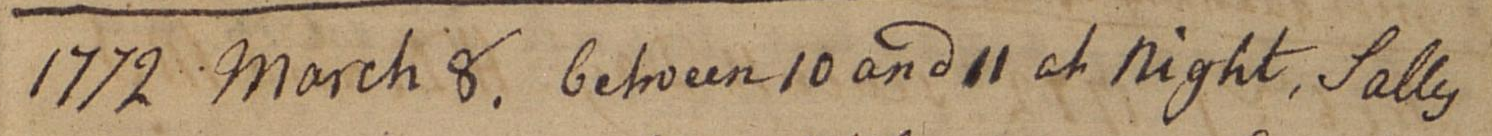1772 March 8. between10 and 11 at night, Sally
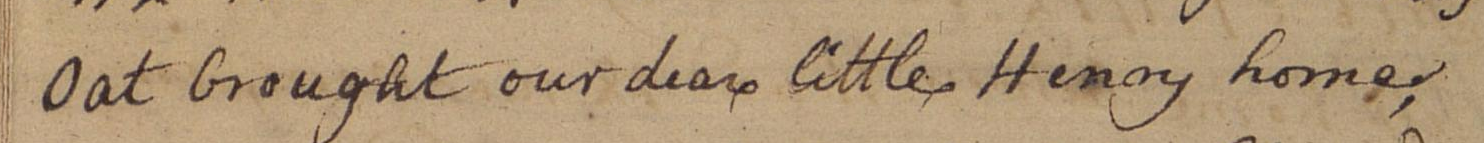Oat brought our dear little Henry home
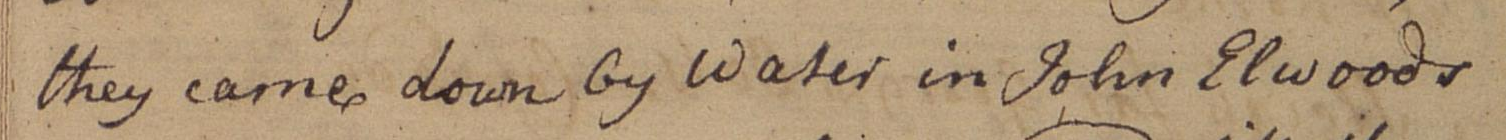they came down by Water in John Elwoods
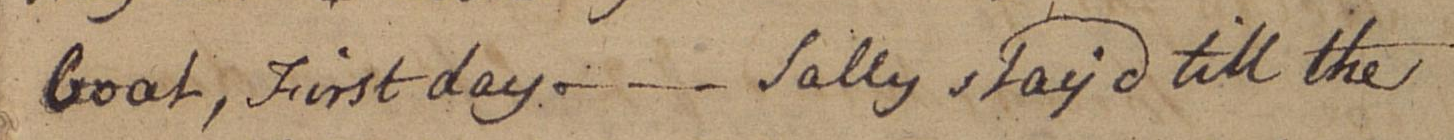boat, First day--- Sally stay'd till the
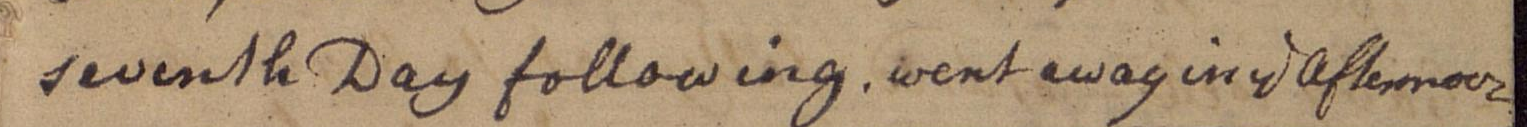seventh Day followinng, went away in y^e Afternoon
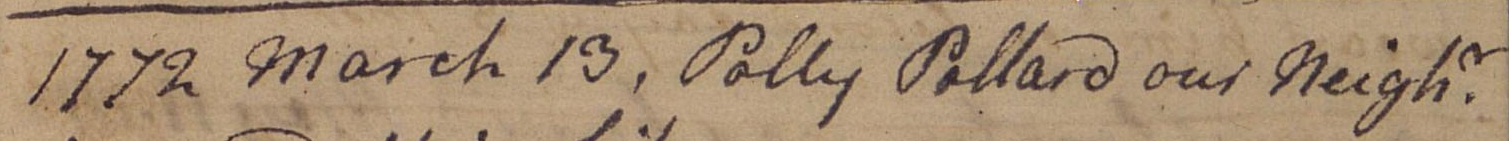1772 March 13. Polly Pollard our Neigh^r.
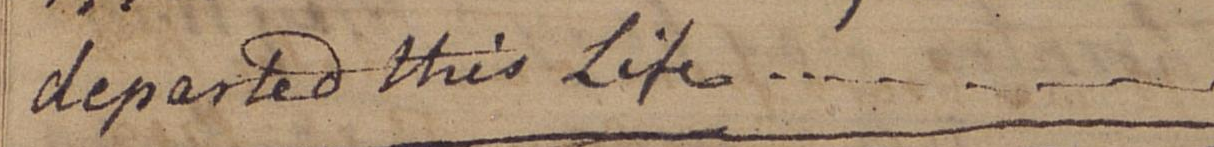departed this Life -
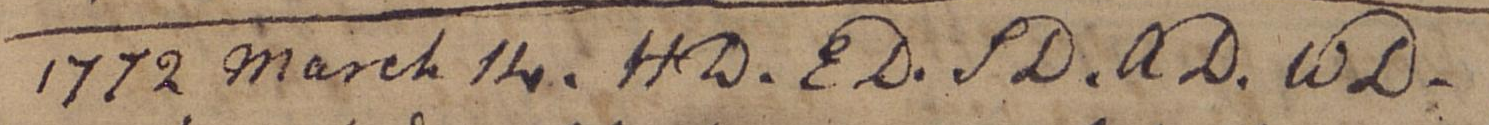1772 march 14. HD. E D. SD. A D. WD-
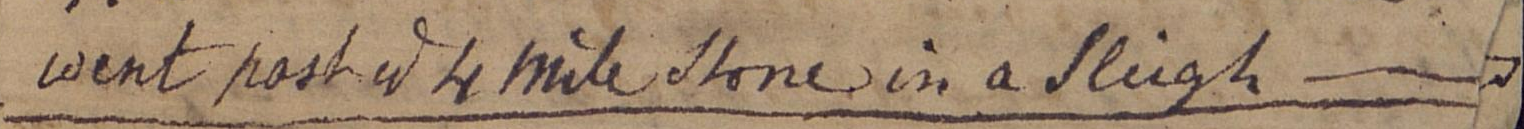went past y^e mile stone in a sleigh-
